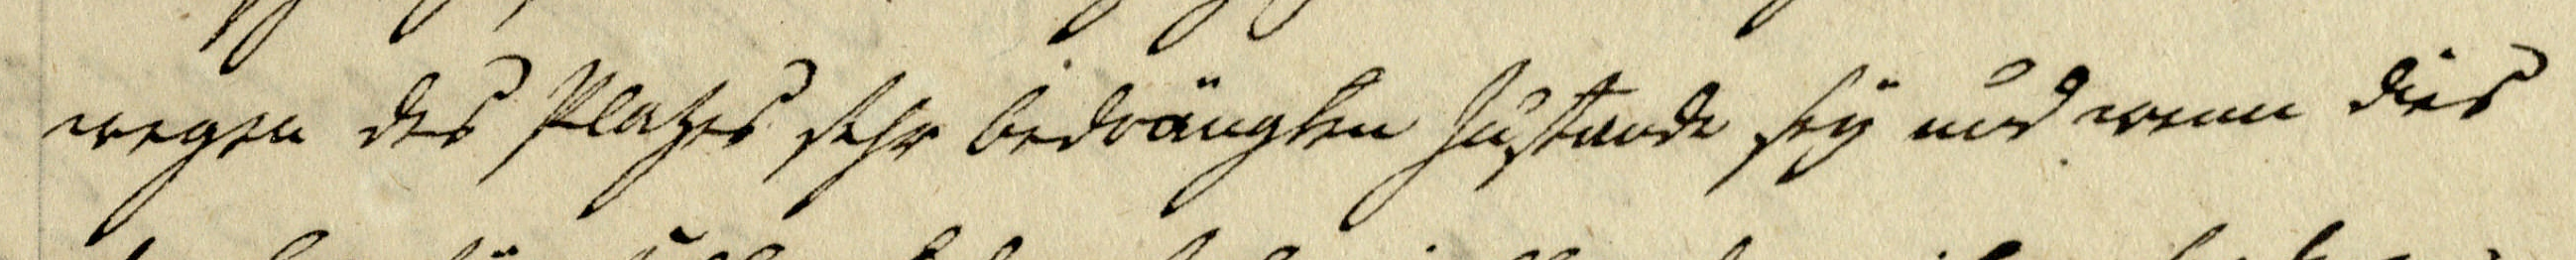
wegen des Platzes sehr bedrängten Zustande seÿ und wenn dies
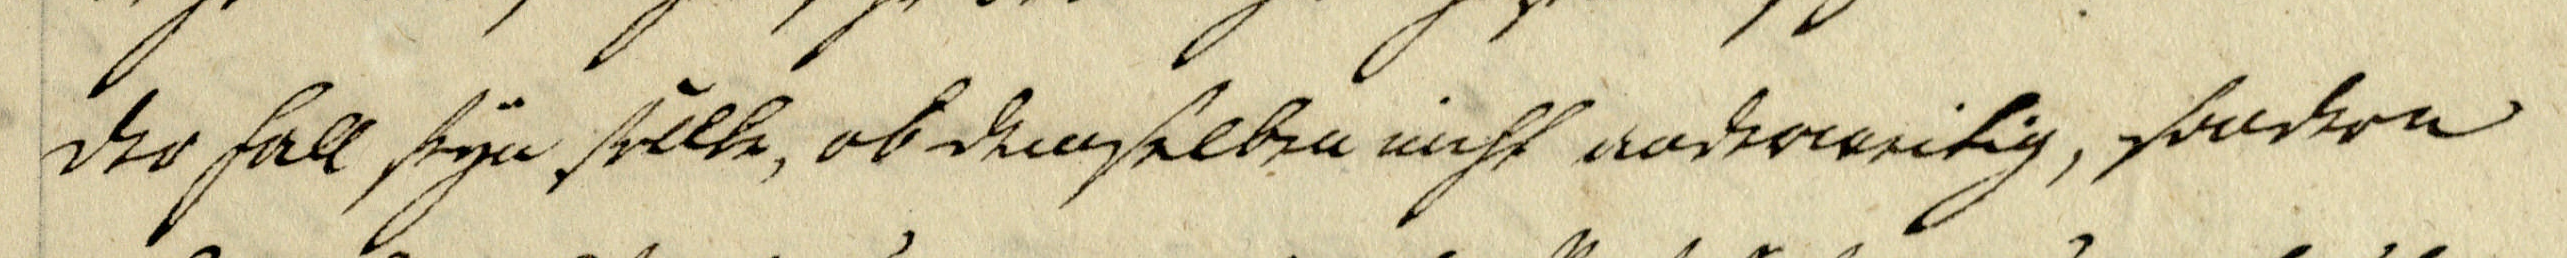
der Fall seÿn sollte, ob demselben nicht anderweitig, sondern
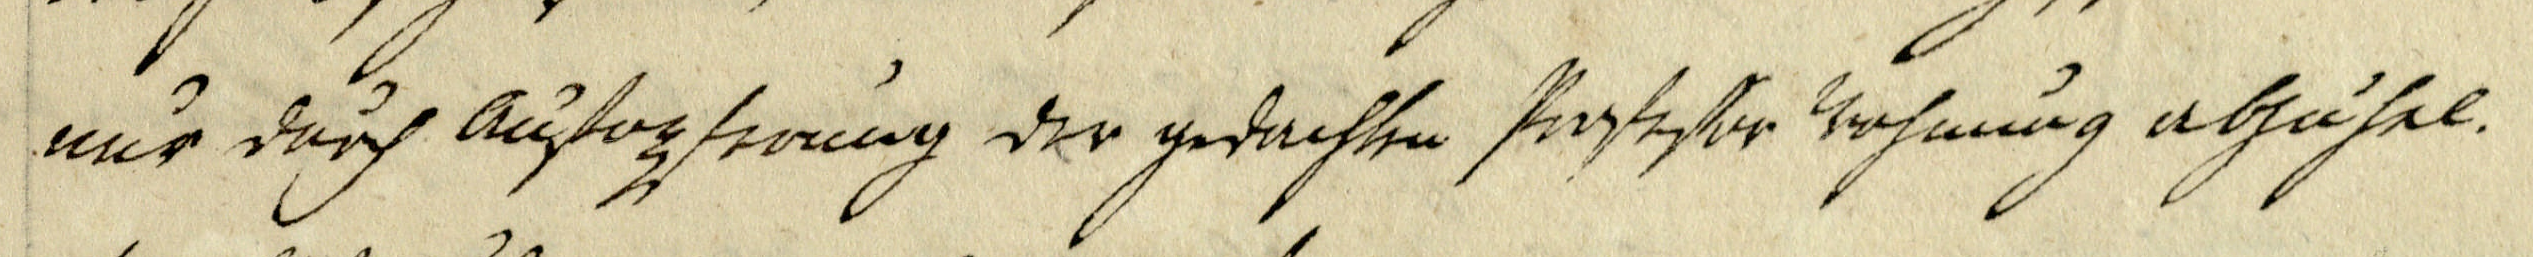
nur durch Aufopferung der gedachten Professor Wohnung abzuhel¬
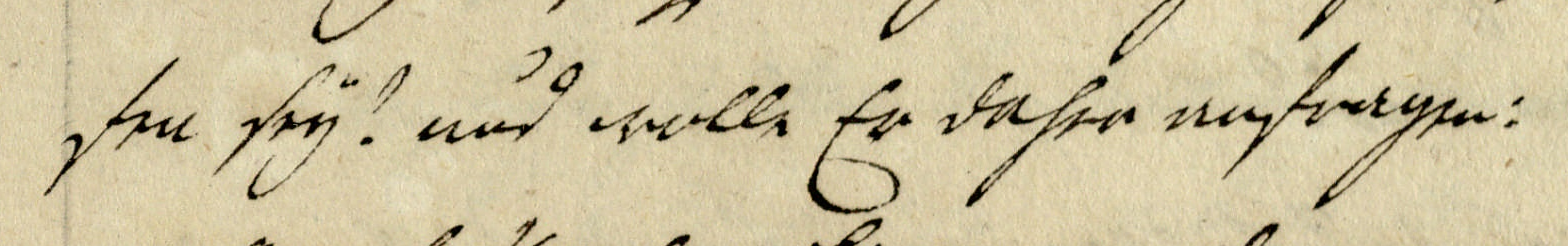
fen seÿ? und wolle Er daher anfragen:
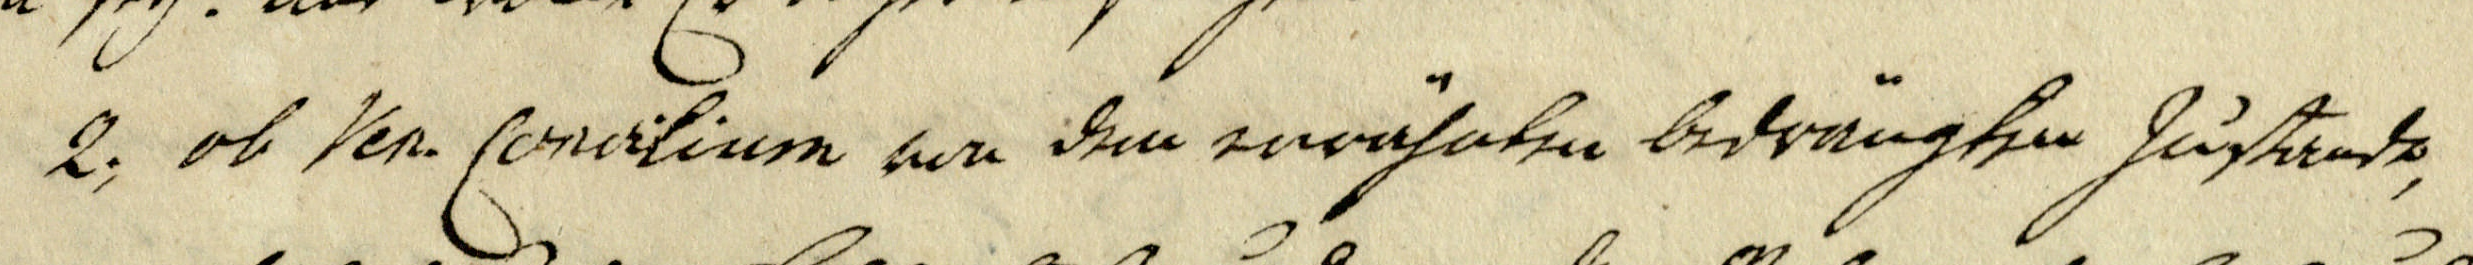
2. ob Ven. Concilium von dem erwähnten bedrängten Zustande,
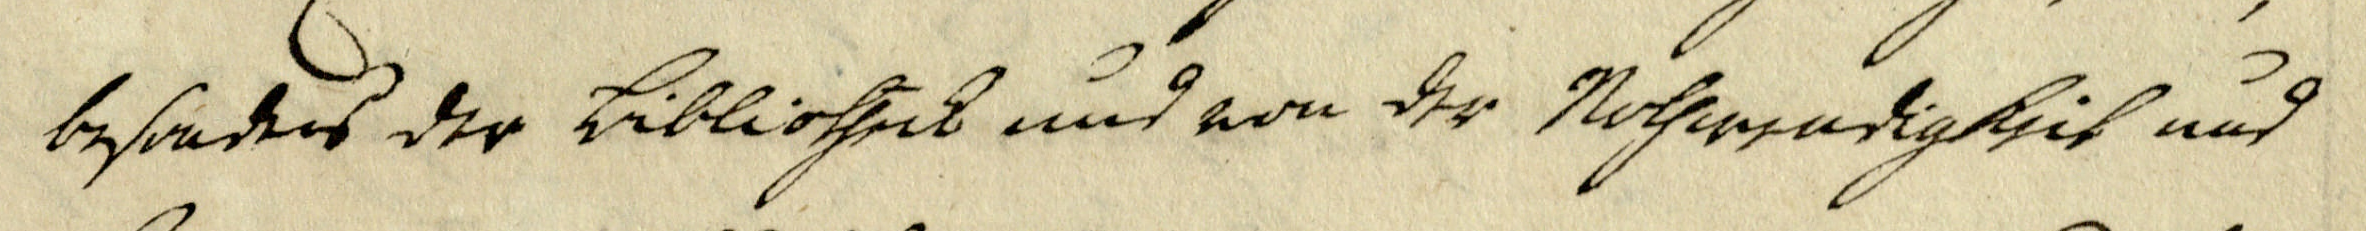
besonders der Bibliothek und von der Nothwendigkeit und
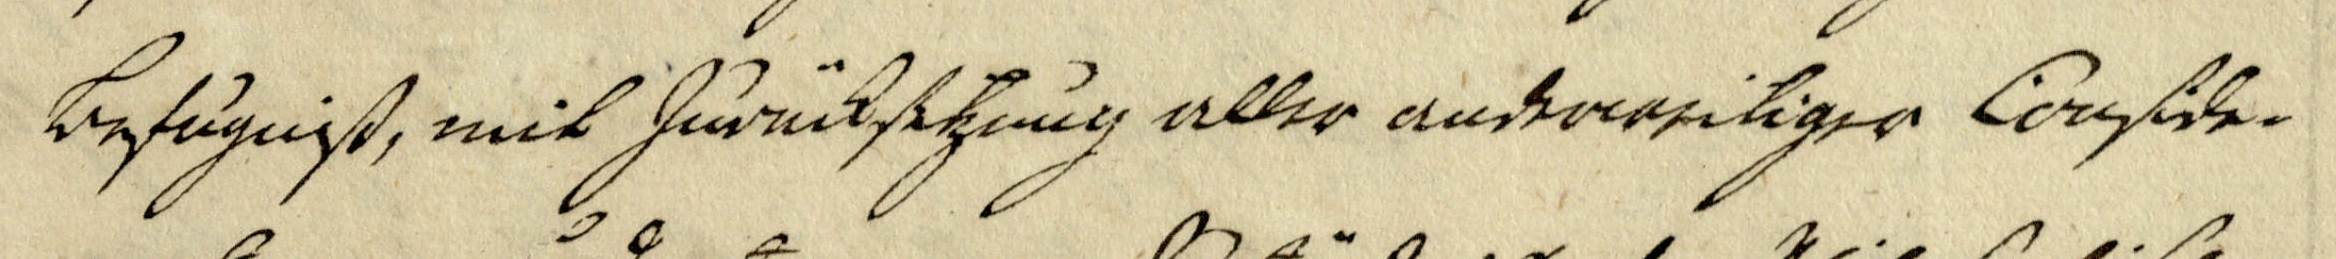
Befugniß, mit Zurücksetzung aller anderweitiger Conside¬
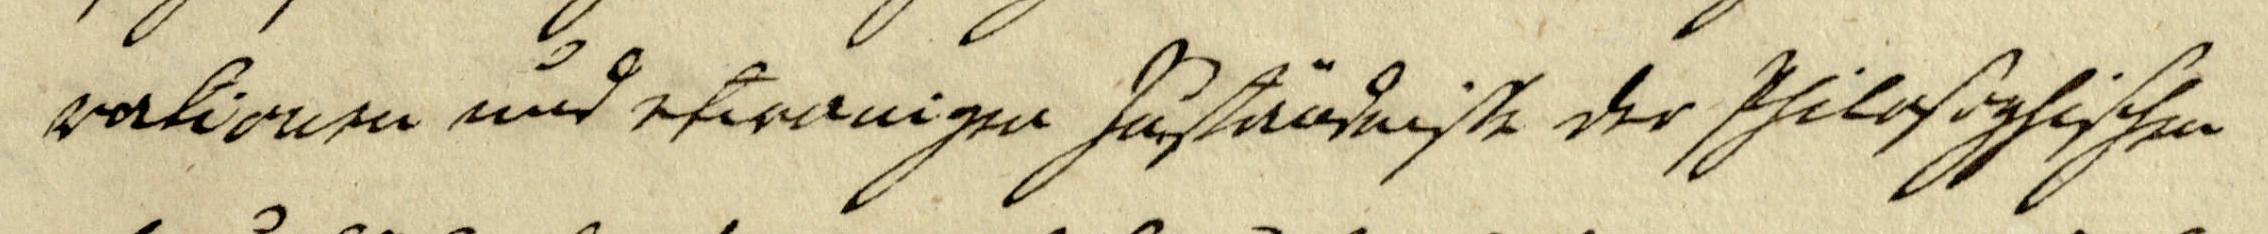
rationen und etwanigen Zuständisse der Philosophischen
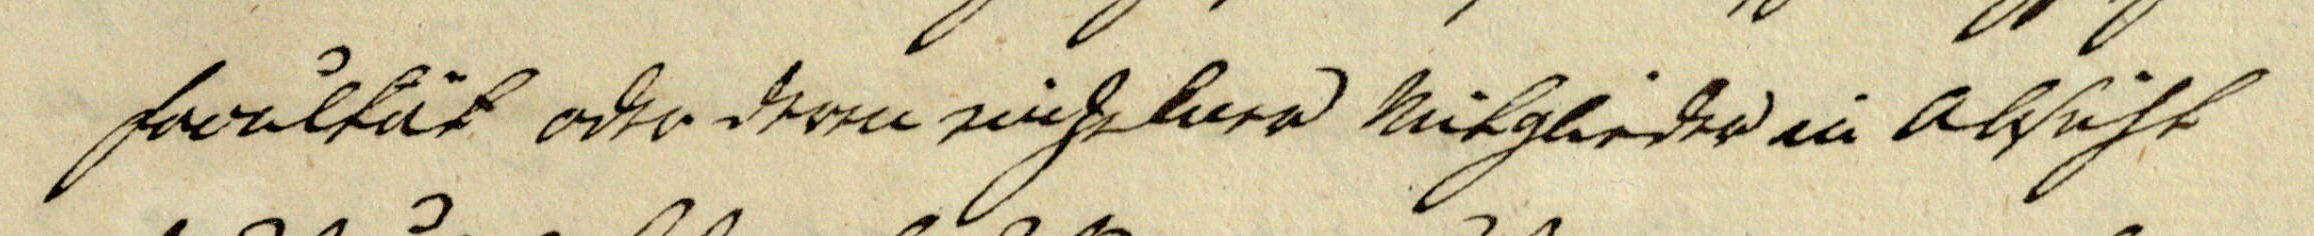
Facultät oder deren einzelner Mitglieder in Absicht
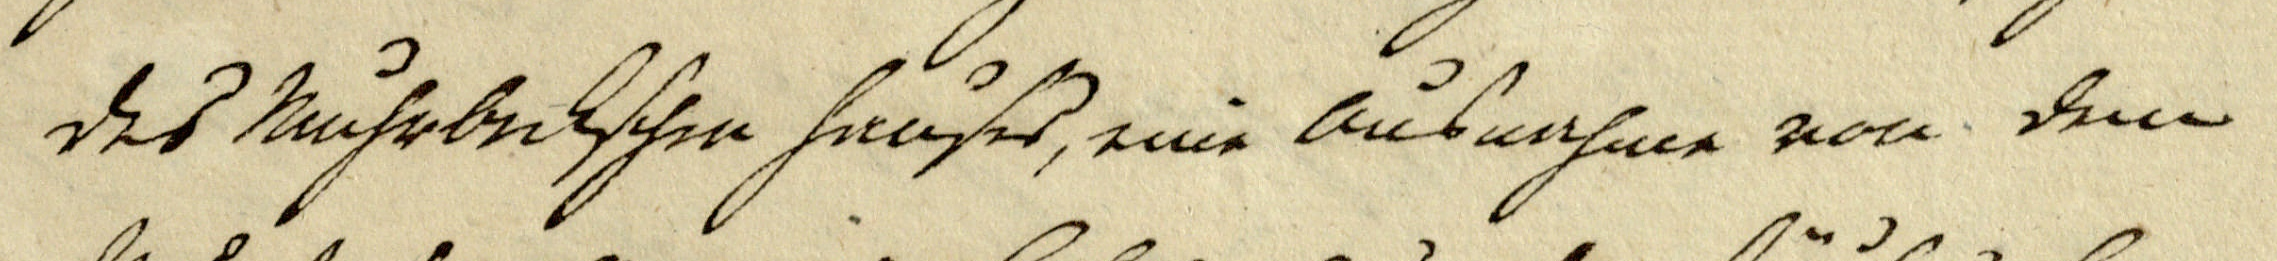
des Muhrbeckschen Hauses, eine Ausnahme von dem
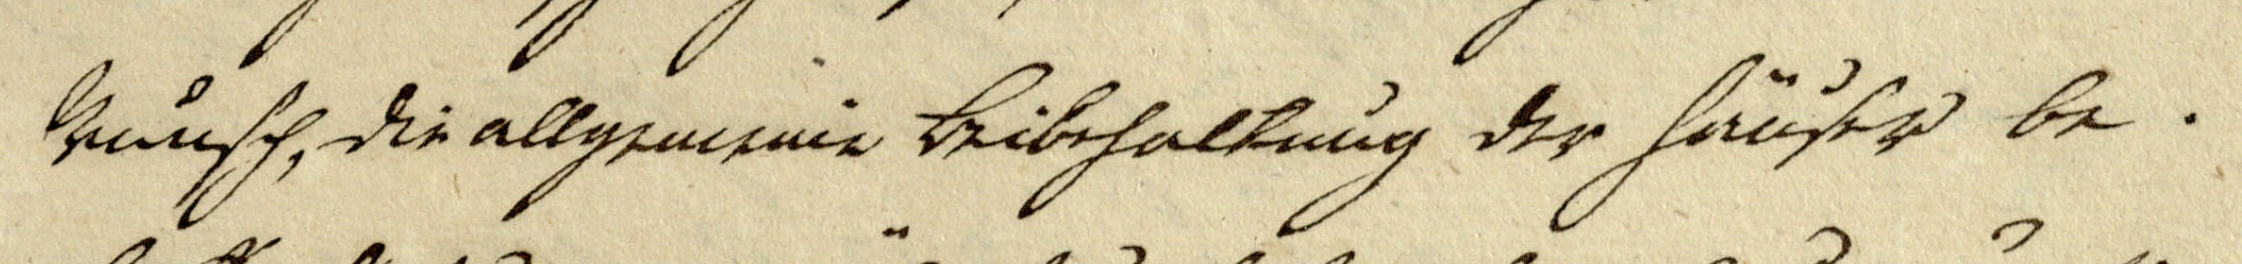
Wunsch, die allgemeine Beibehaltung der Häuser be¬
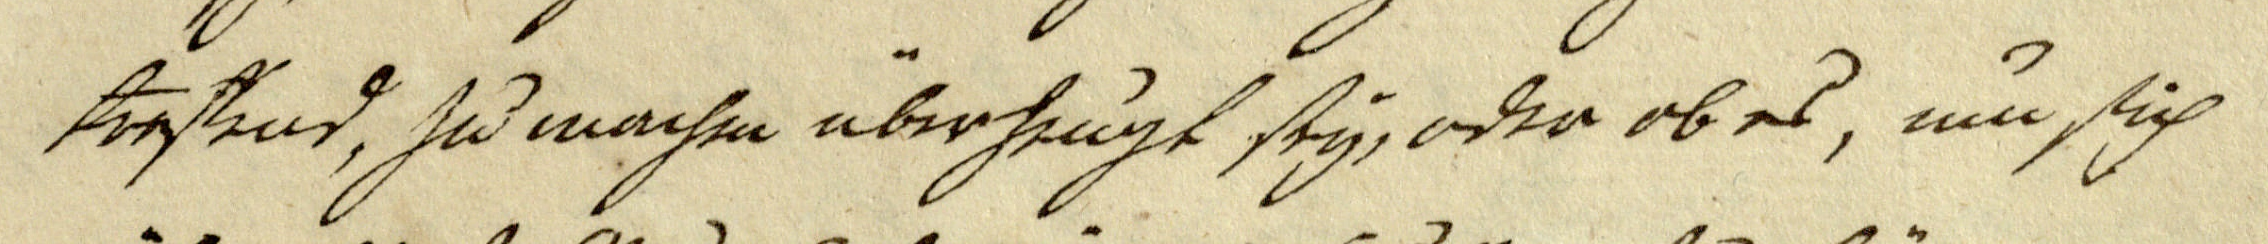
treffend, zu machen überzeugt seÿ, oder ob es, um sich
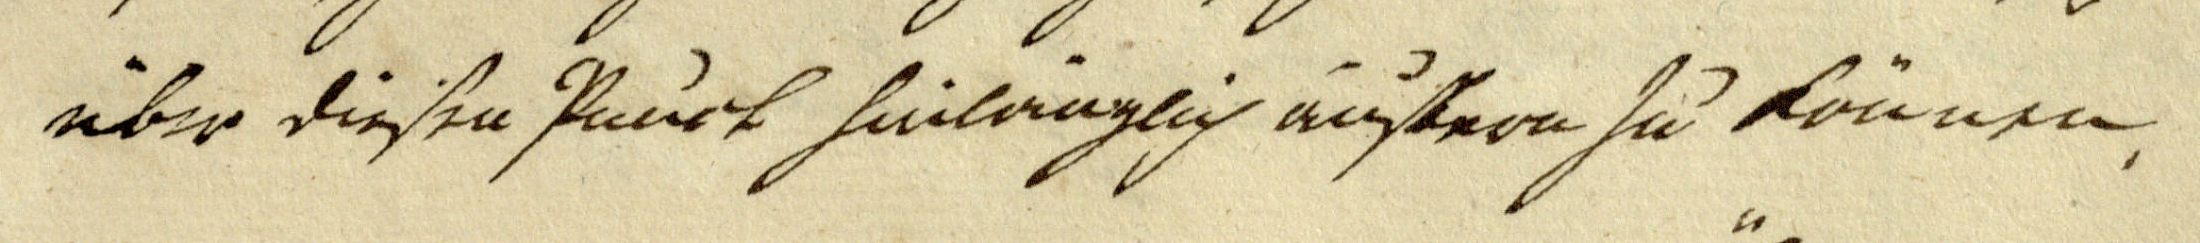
über diesen Punct hinlänglich äussern zu können,
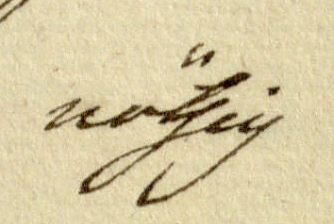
nöthig
